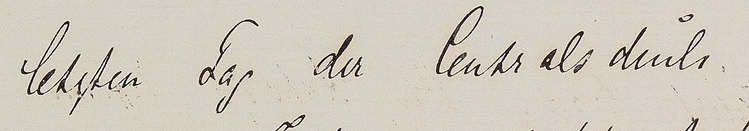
letzten Tag der Centralschule
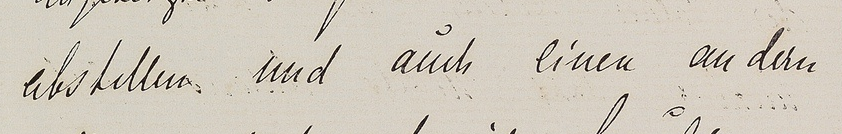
abstellen und auch einen andern
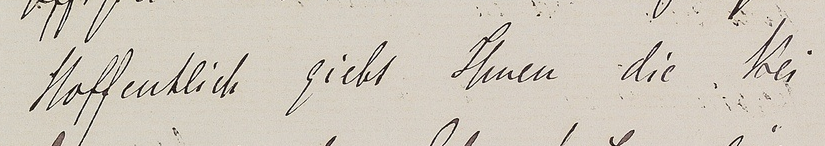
Hoffentlich giebt Ihnen die Bei-
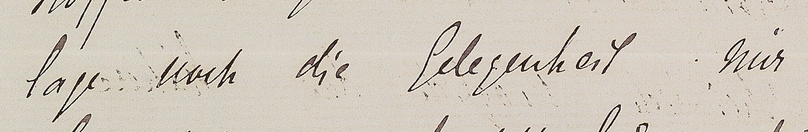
lage noch die Gelegenheit mir
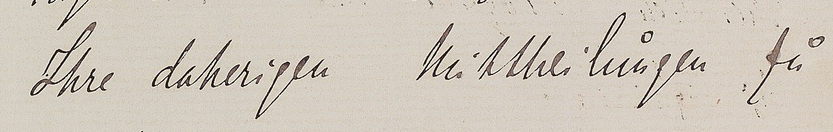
Ihre daherigen Mittheilungen zu
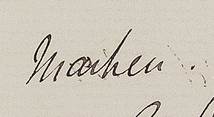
machen.
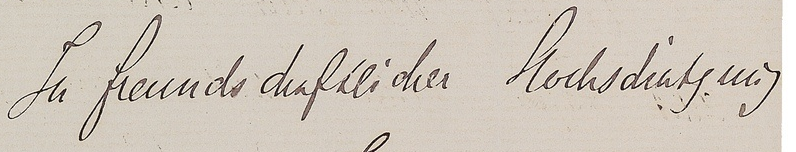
In freundschaftlicher Hochschätzung
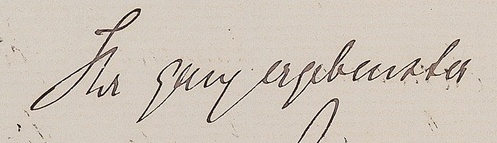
Ihr ganz ergebenster
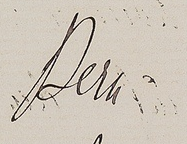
E Welti
